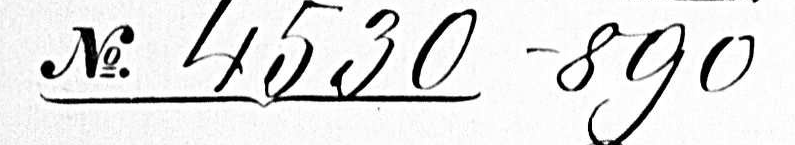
No. 4530 - 890
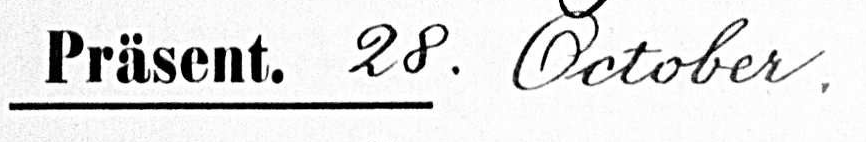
Präsent. 28. October.
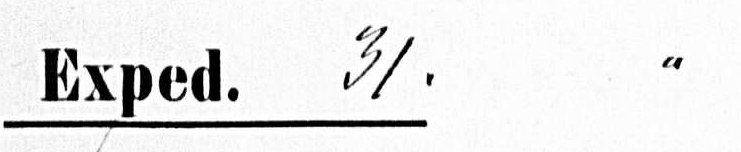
Exped. 31.October.
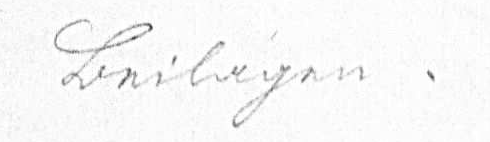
Beilagen.
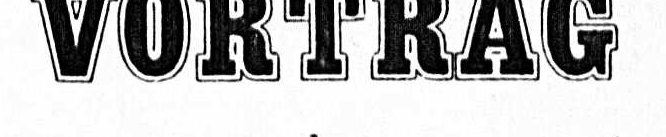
Vortrag
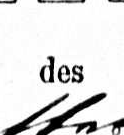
des
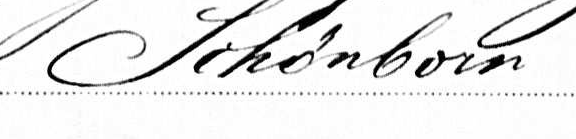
Schönborn
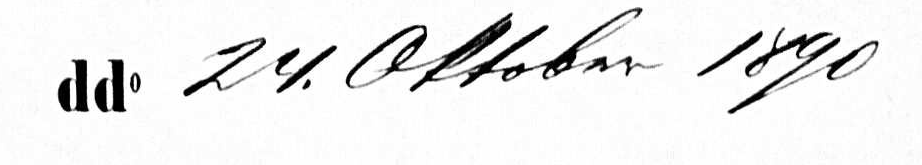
ddo 24. Oktober 1890
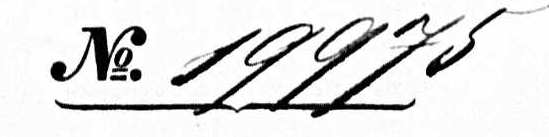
No. 19975
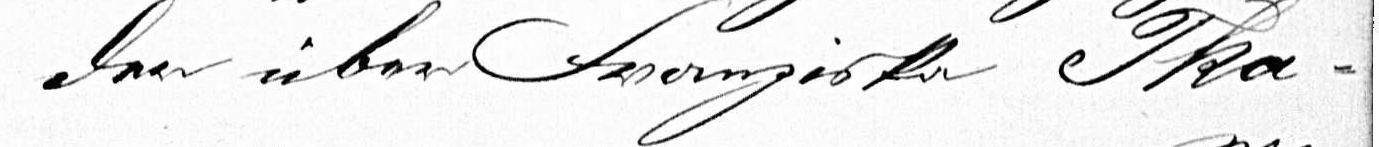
der über Franziska Tkac¬
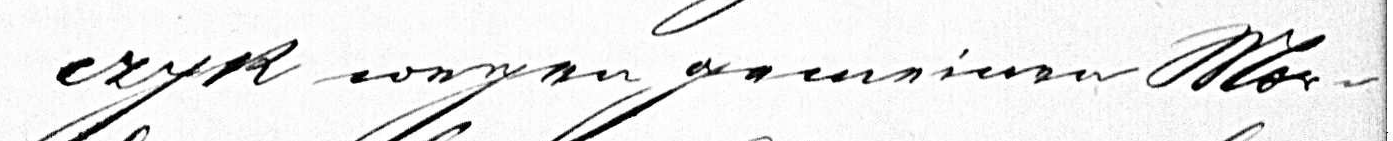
zyk wegen gemeinen Mor¬
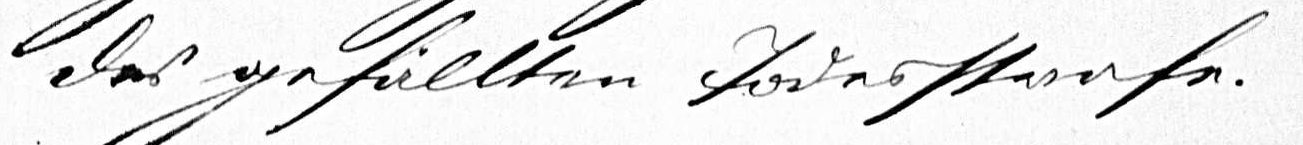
des gefällten Todesstrafe.
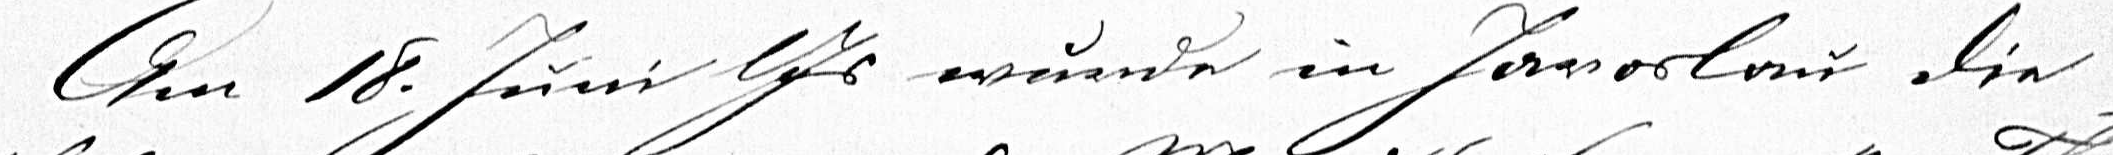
Am 18. Juni lJs wurde in Jaroslau die
